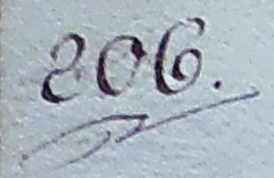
206.
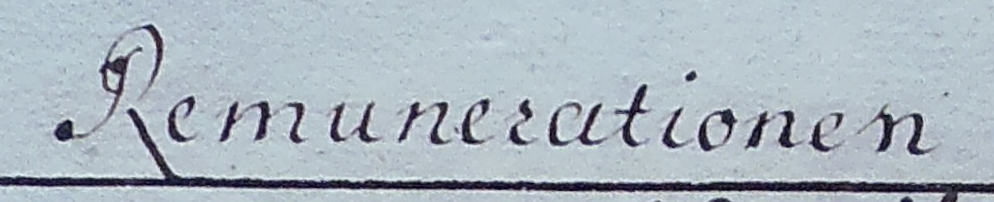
Remunerationen
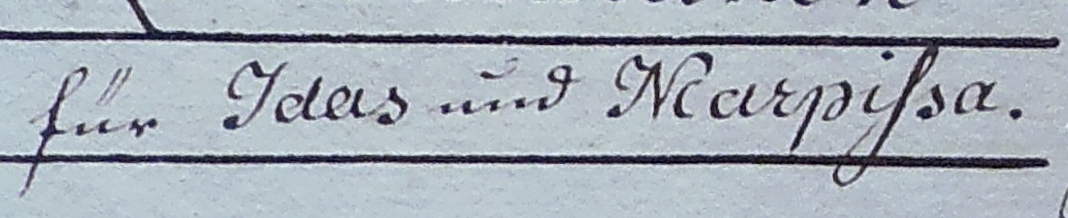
für Idas und Marpissa.
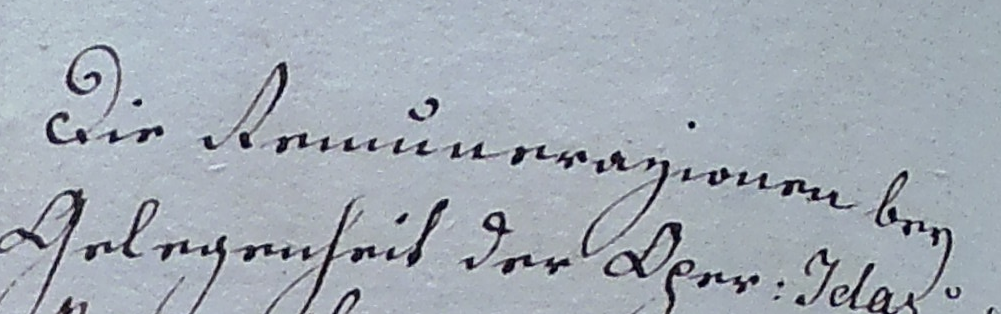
Die Remunerazionen bey
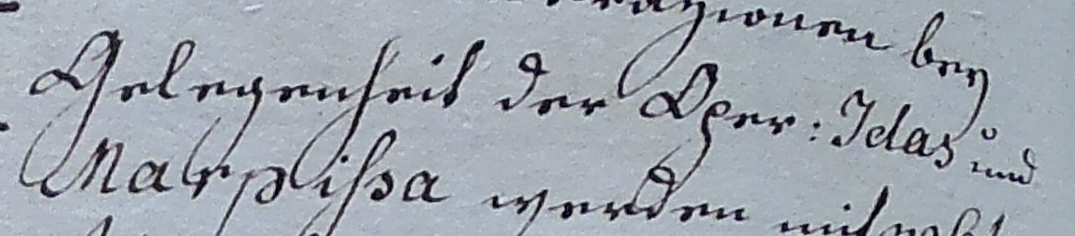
Gelegenheit der Oper: Idas und
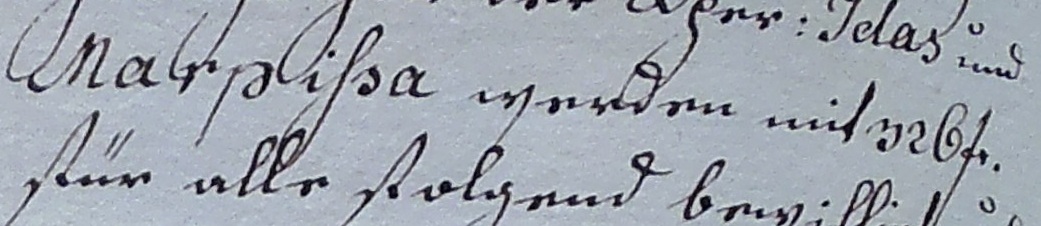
Marpissa werden mit 326fr.
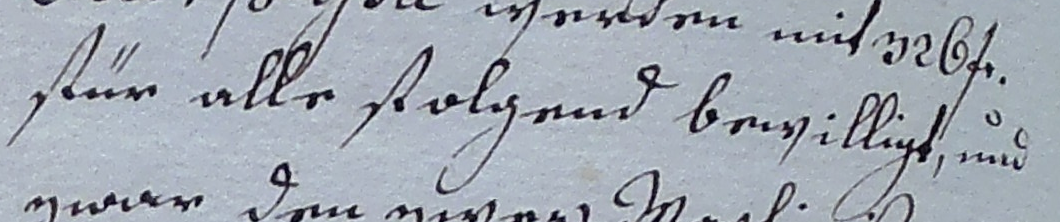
für alle folgend bewilligt, und
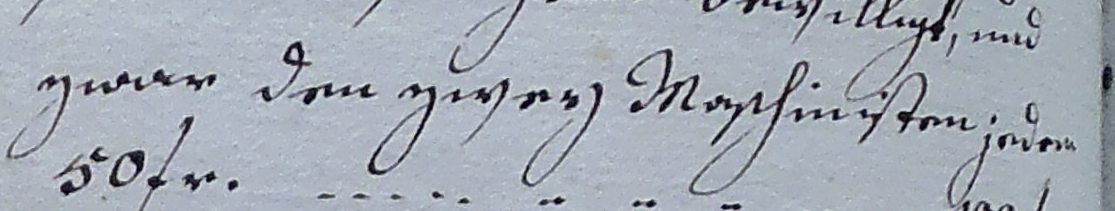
zwar den zwey Maschinisten jedem
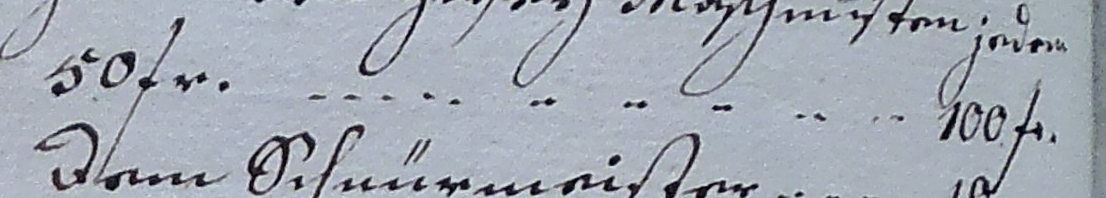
50fr. ..... .. .. .. .. .. 100fr.
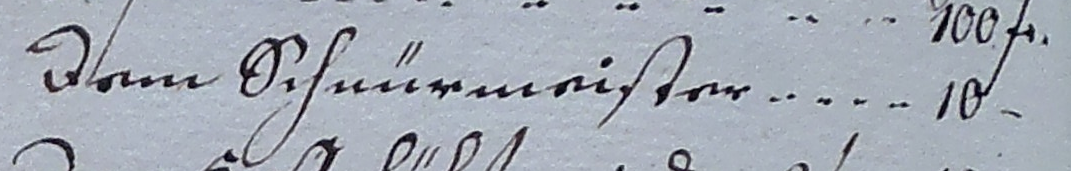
Dem Schnürmeister .. .. . .. 10 -
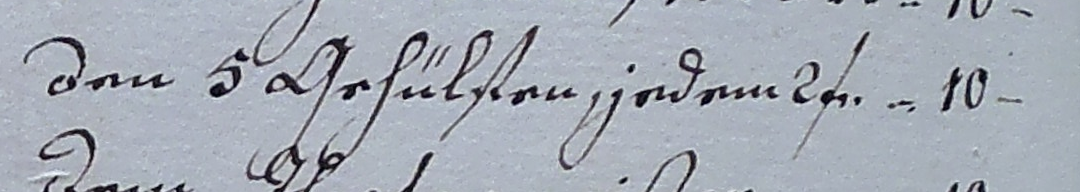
Den 5 Gehülfen, jedem 5fr .. 10 -
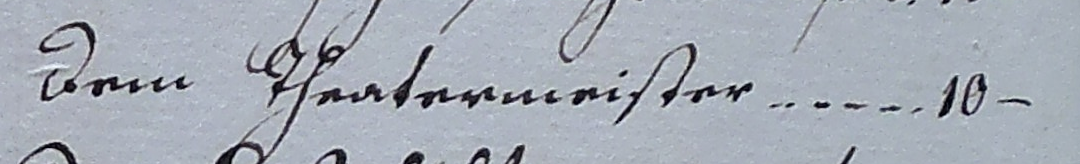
Dem Theatermeister .. . .. .. . 10 -
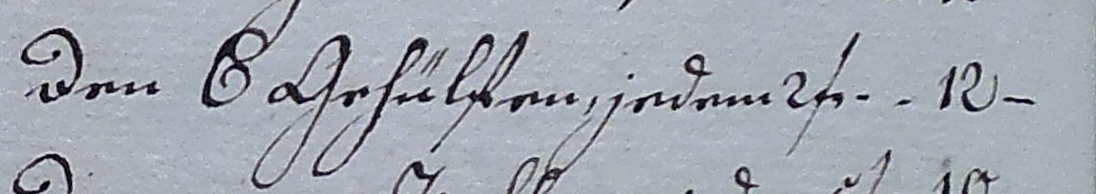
Den 6 Gehülfen, jedem 2fr. . 12 -
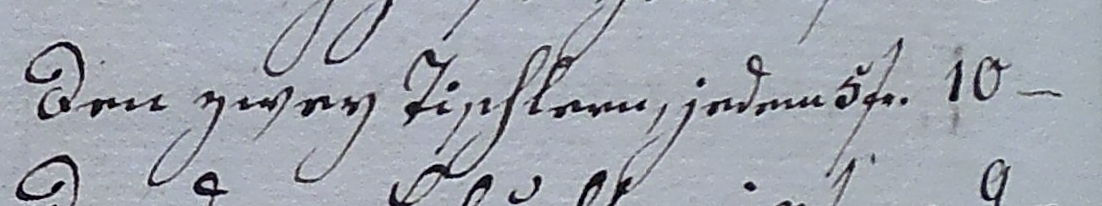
Den zwey Tischlern, jede8 5fr. 10 -
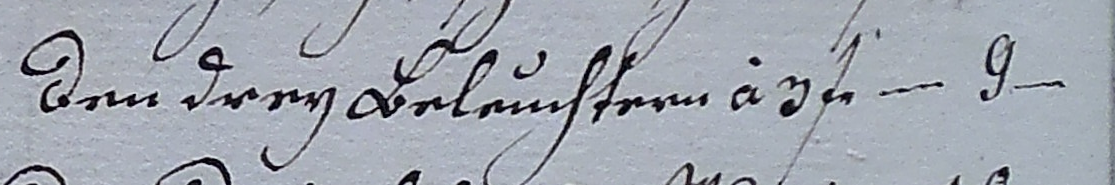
Den drey Beleuchtern à 3fr .... 9 -
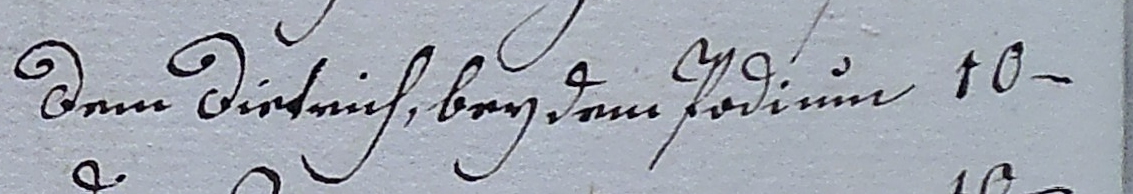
Ve Dietichbeyden Podiun 10.
